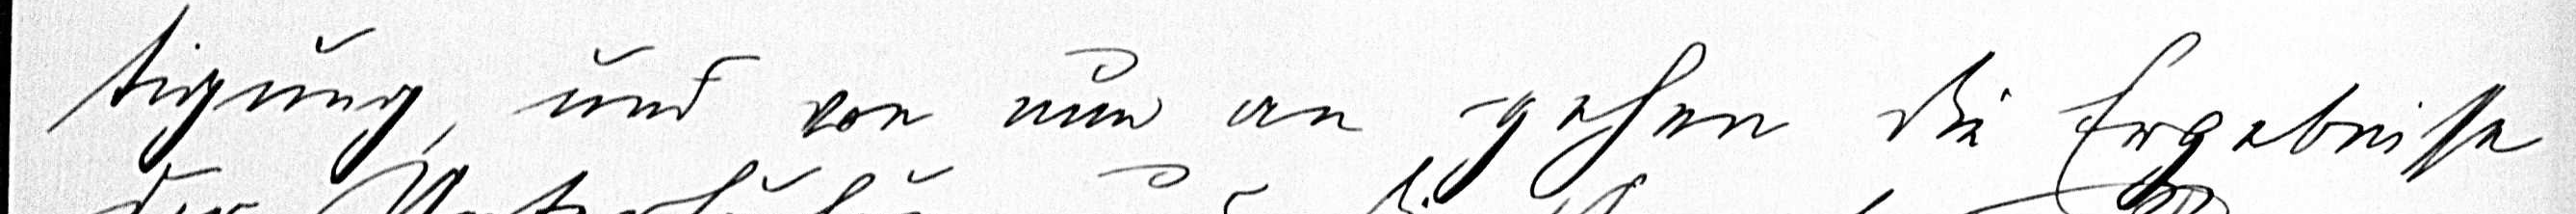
tigung, und von nun an gehen die Ergebnisse
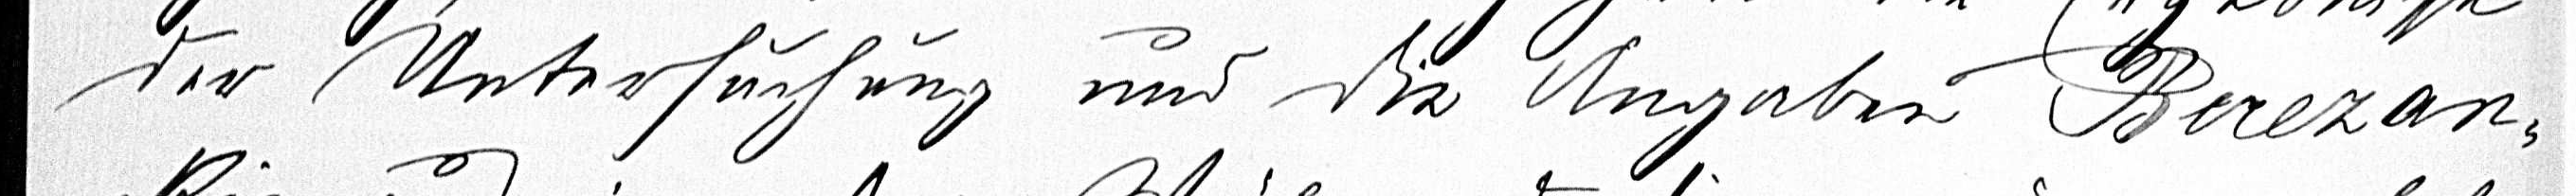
der Untersuchung und die Angaben Berezan¬
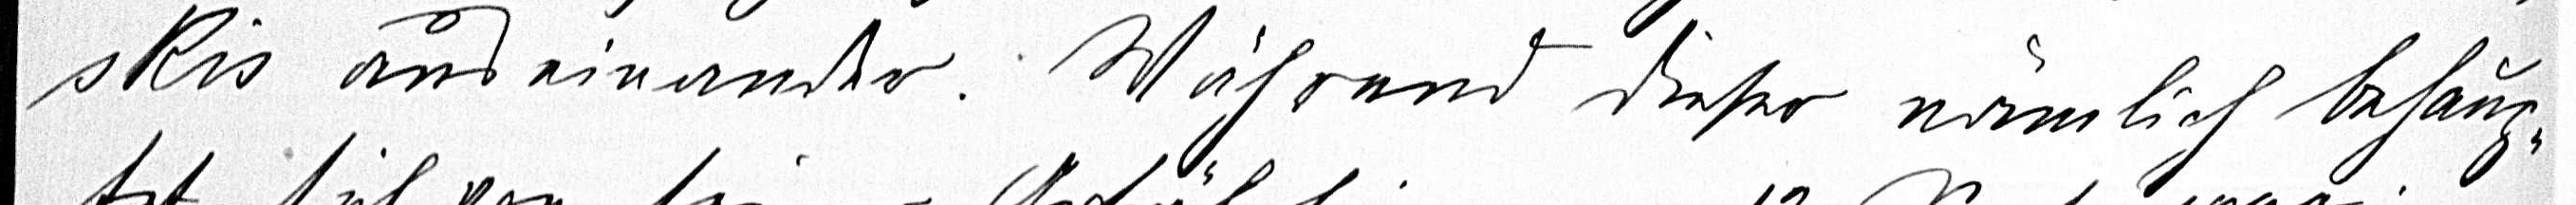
skis auseinander. Während dieser nämlich behaup¬
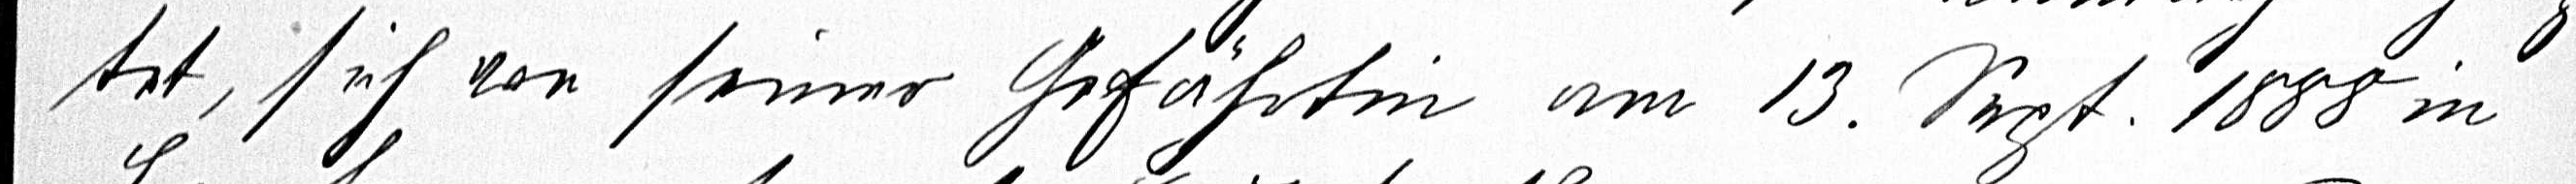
tet, sich von seiner Gefährtin am 13. Sept. 1888 in
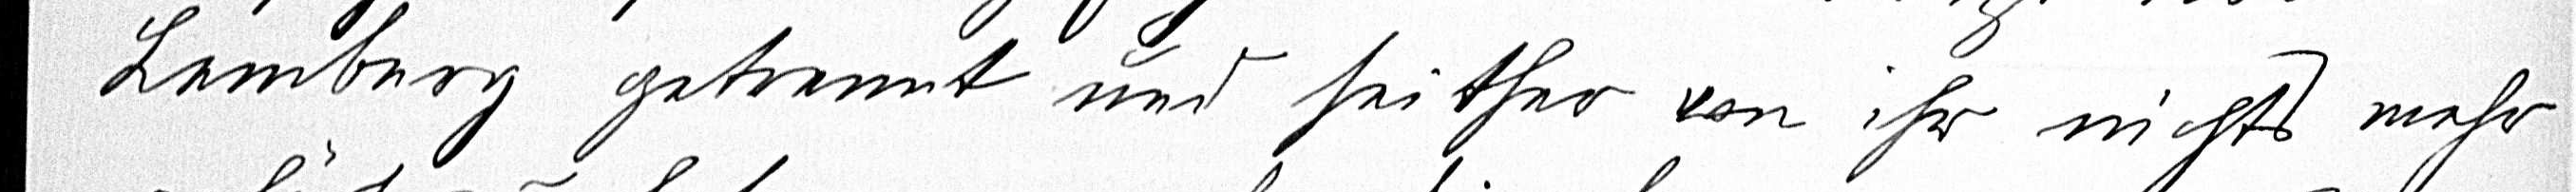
Lember getrennt und seither von ihr nicht mehr
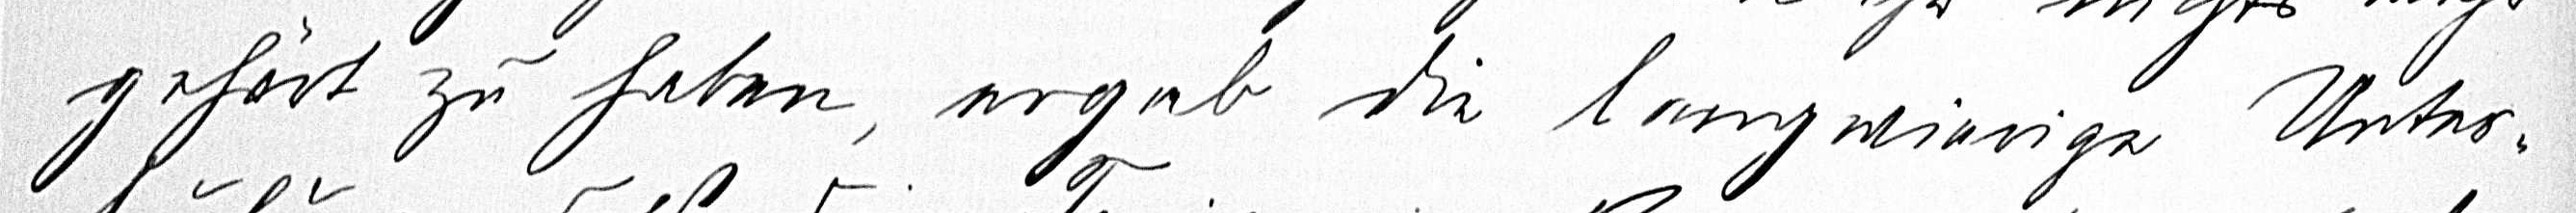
gehört zu haben, ergab die langwierige Unter¬
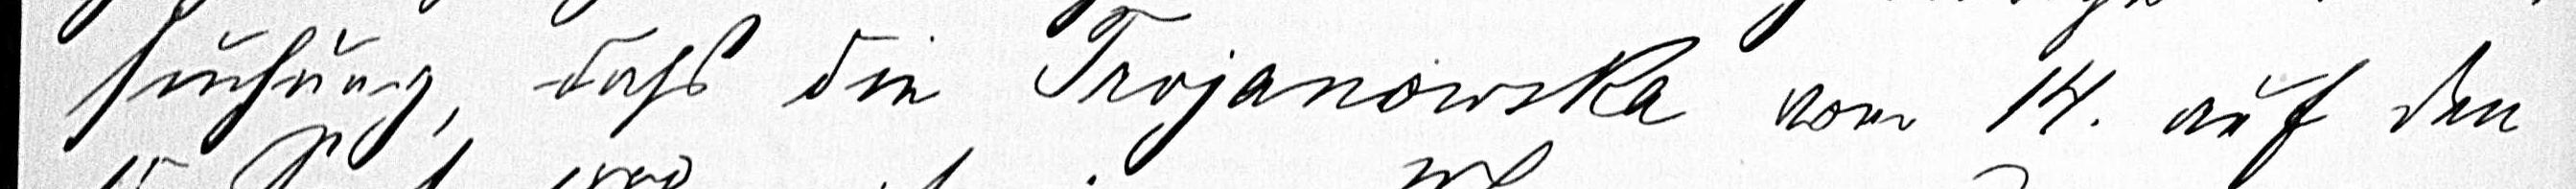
suchung, daß die Trojanowska vom 13. Auf den
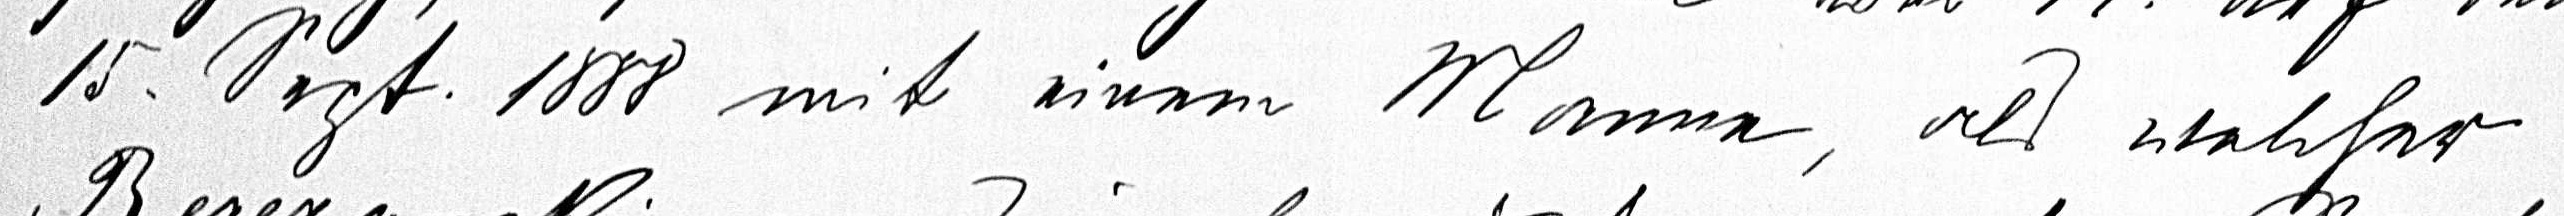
15. Sept 1888 mit einem Manne, als welcher
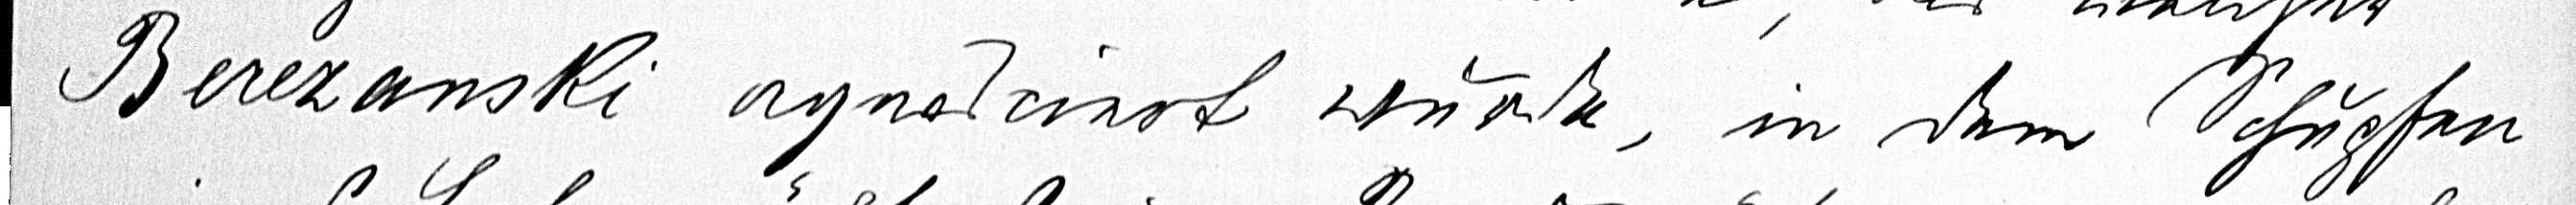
Berezanski angosciert wurde, in dem Schupfen
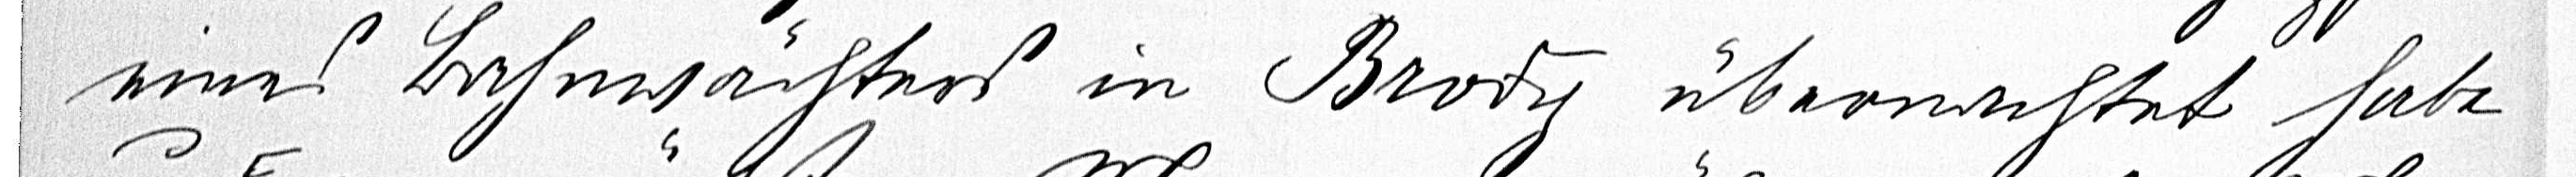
eines Bahnwächters in Brody übernachtet habe
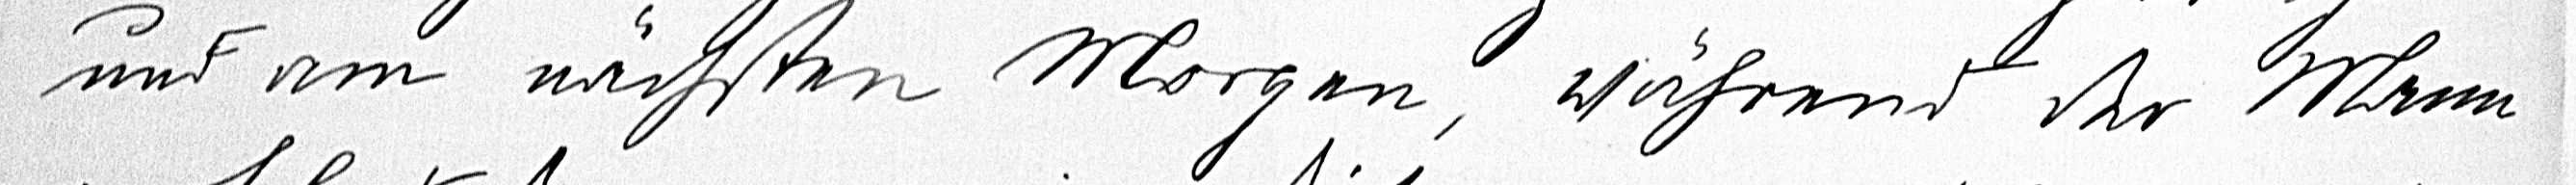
und am nächsten Morgen, während der Mann
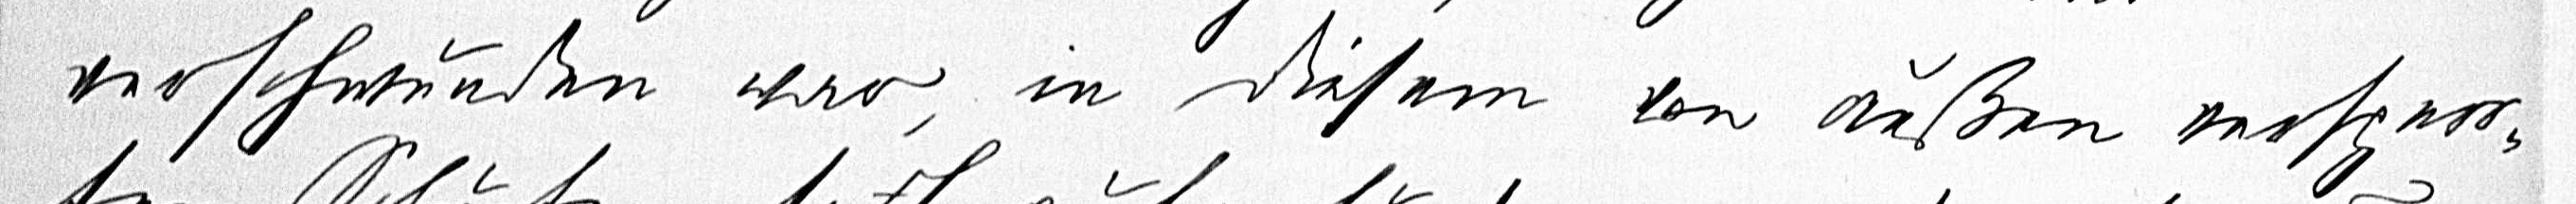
verschwunden war, in diesem von außen versperr¬
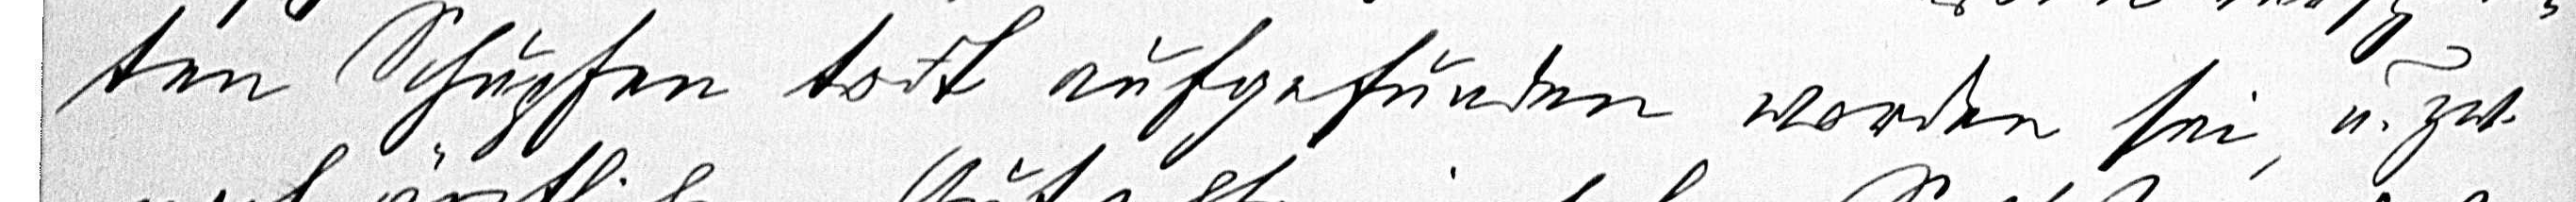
ten Schupfen todt aufgefunden worden sei, u. zw.
